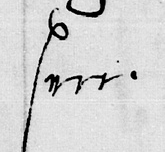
sen.
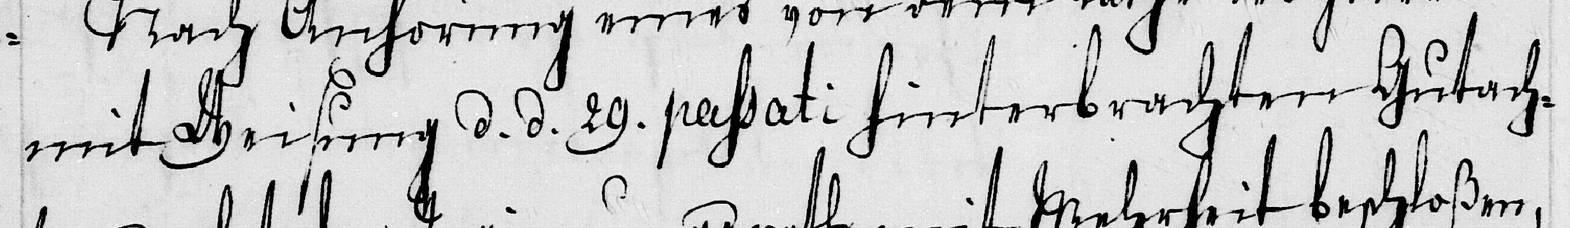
mit Weisung d. d. 29. passati hinterbrachten Gutach¬
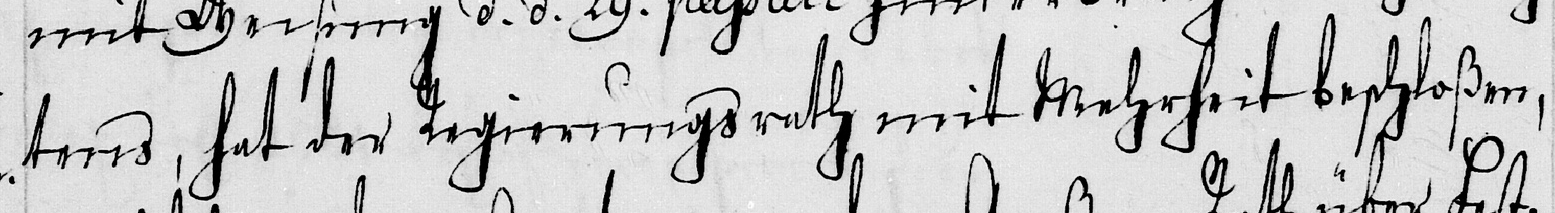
tens, hat der Regierungsrath mit Mehrheit beschloßen,
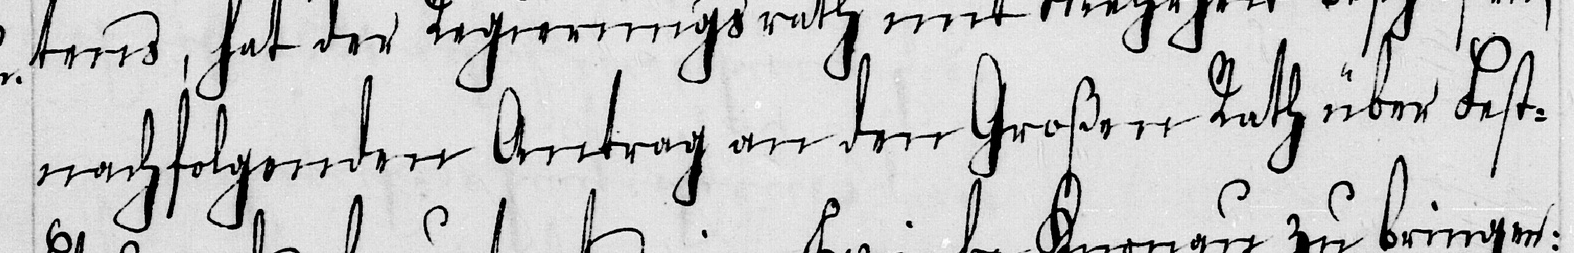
nachfolgenden Antrag an den Großen Rath über Fest¬
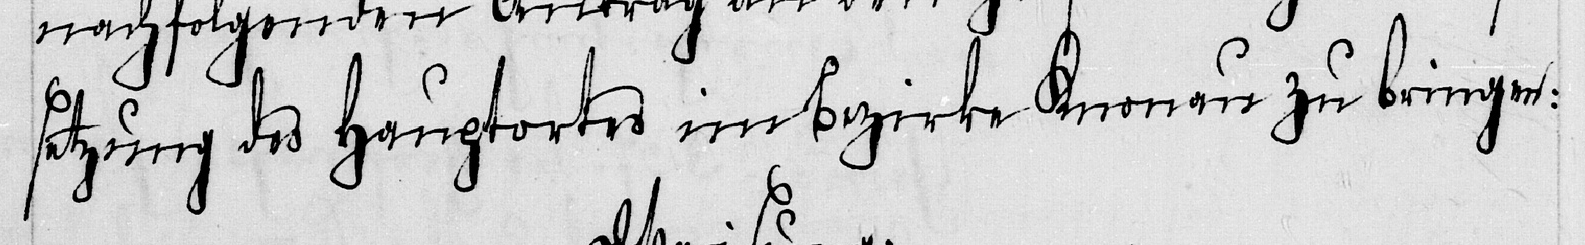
setzung des Hauptortes im Bezirke Knonau zu bringen:
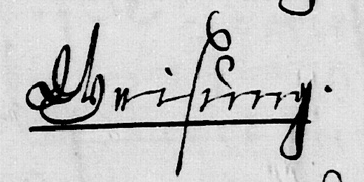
Weisung.
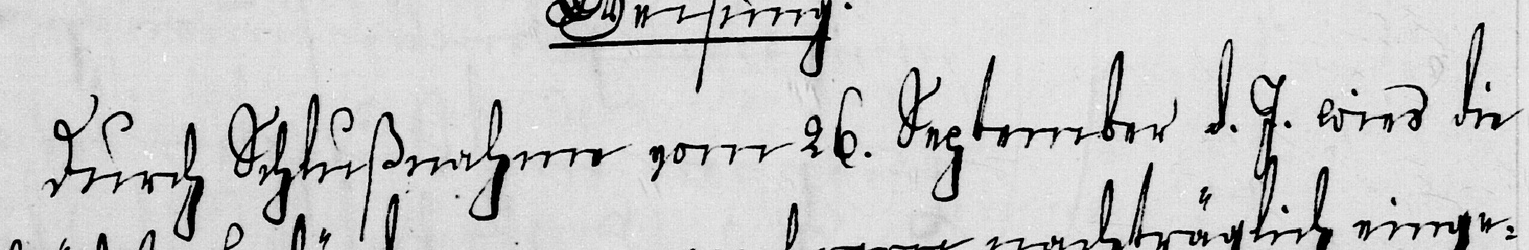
Durch Schlußnahme vom 26. September d. J. wies die
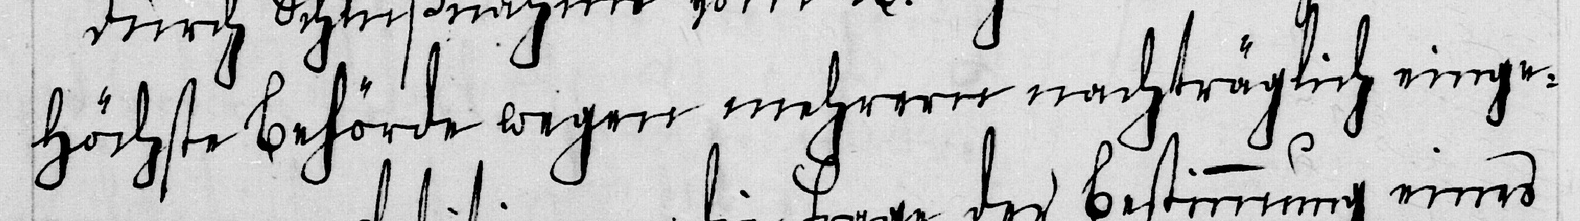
Höchste Behörde wegen mehrern nachträglich einge¬
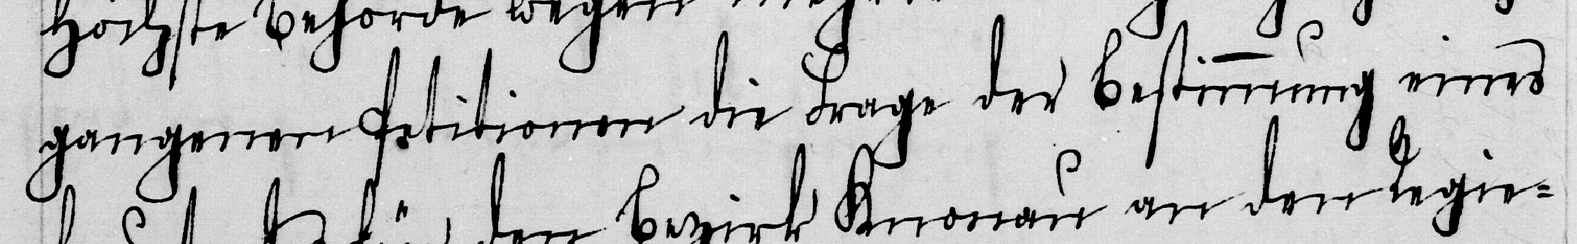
gangenen Petitionen die Frage der Bestimmung eines
